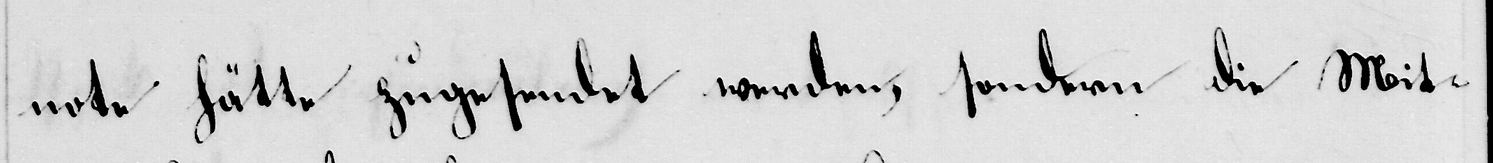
note hätte zugesendet werden, sondern die Mit¬
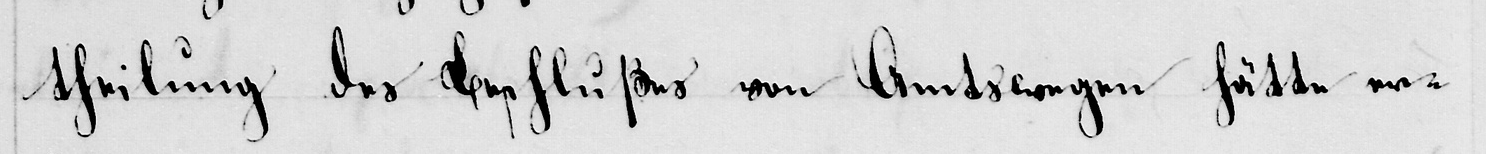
theilung des Beschlußes von Amtswegen hätte er¬
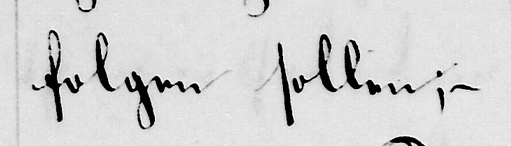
folgen sollen; –
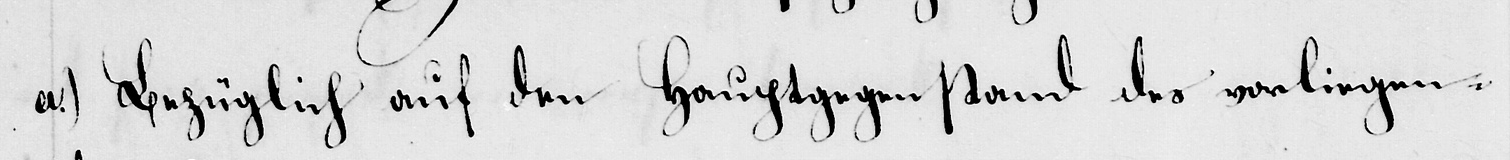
a.) Bezüglich auf den Hauptgegenstand des vorliegen¬
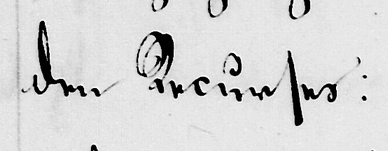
den Recurses:
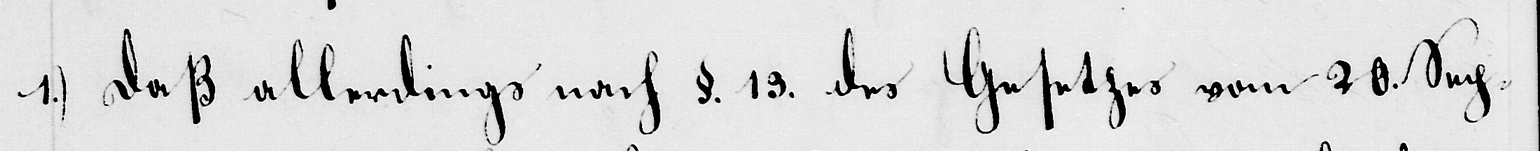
1.) Daß allerdings nach §. 13. des Gesetzes vom 20. Sep¬
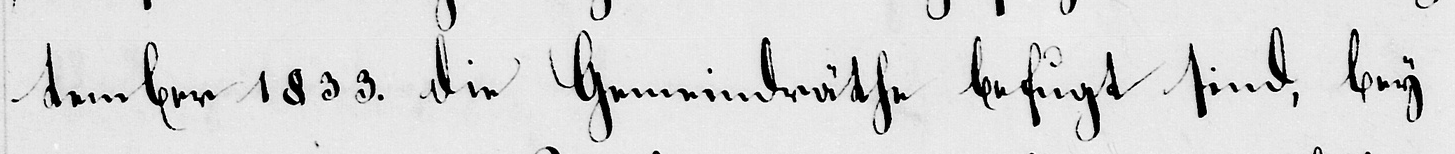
tember 1833. die Gemeindräthe befugt sind, bey
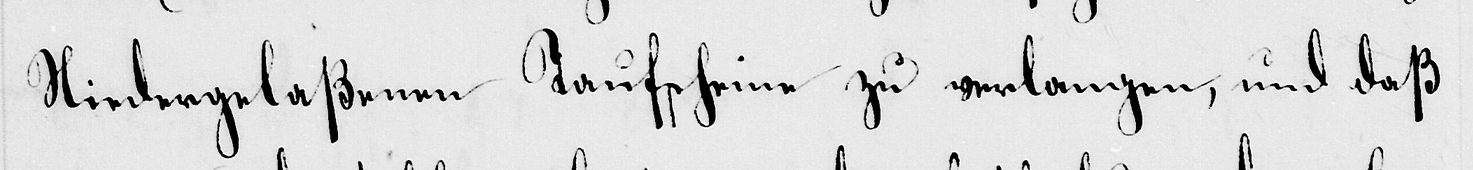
Niedergelaßenen Taufscheine zu verlangen, und daß
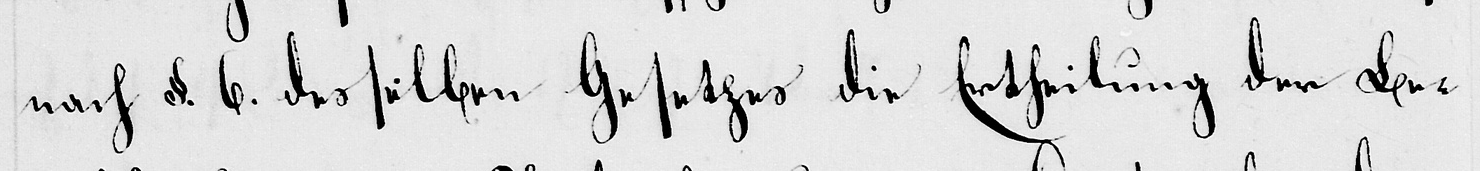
nach §. 6. desselben Gesetzes die Ertheilung der Be¬
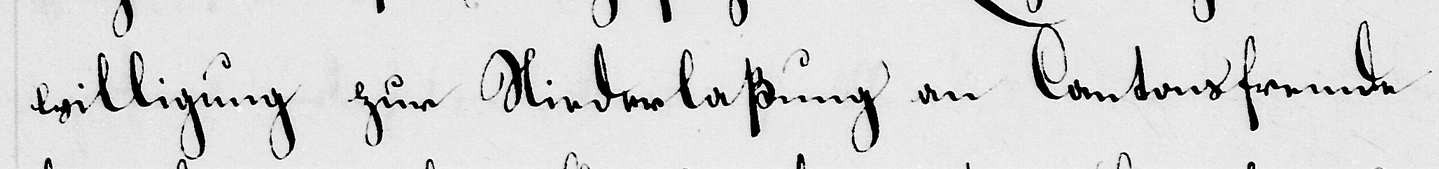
willigung zur Niederlaßung an Cantonsfremde
